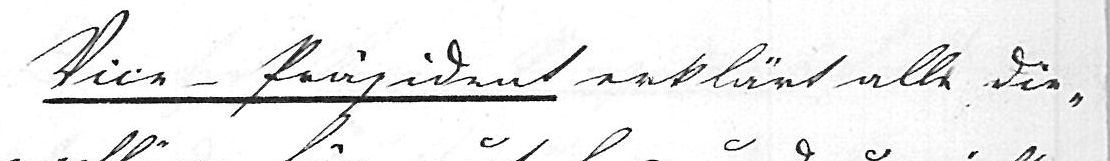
Vice-Präsident erklärt alle die-
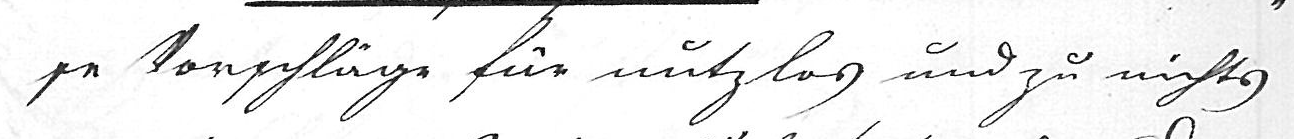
se Vorschläge für nutzlos und zu nichts
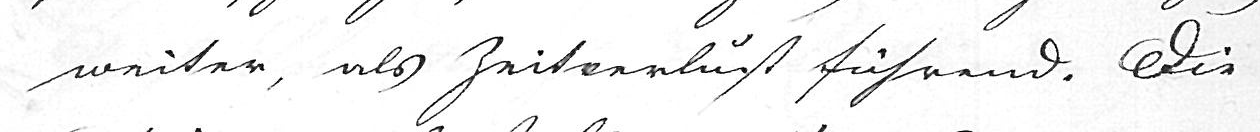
weiter, als Zeitverlust führend. Die
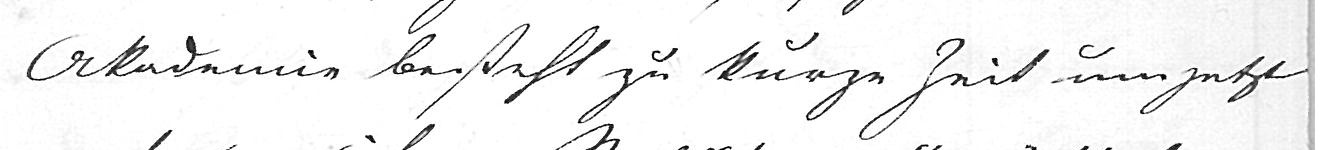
Akademie besteht de kurze Zeit um jetzt
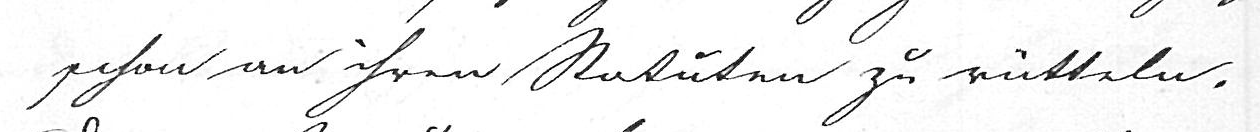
schon an ihren Statuten zu rütteln.
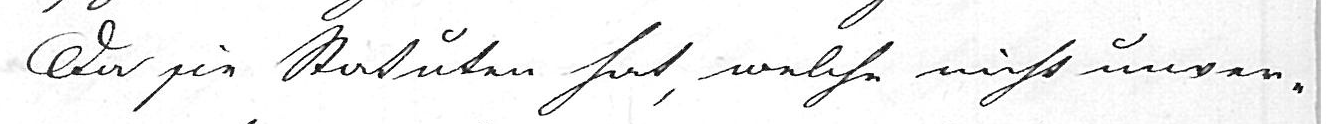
Da sie Statuten hat, welche nicht unver-
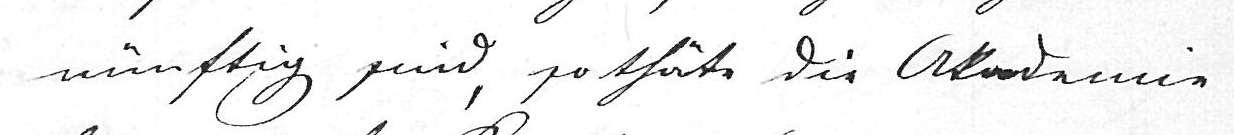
nünftig sind, so thäte die Akademie
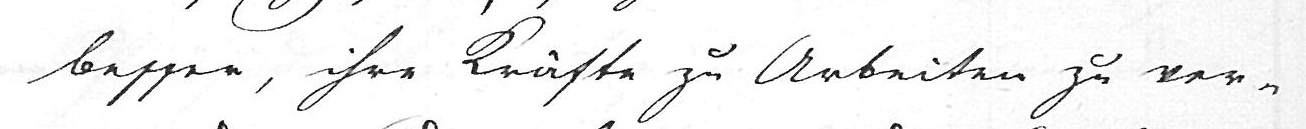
besser, ihre Kräfte zu Arbeiten zu ver-
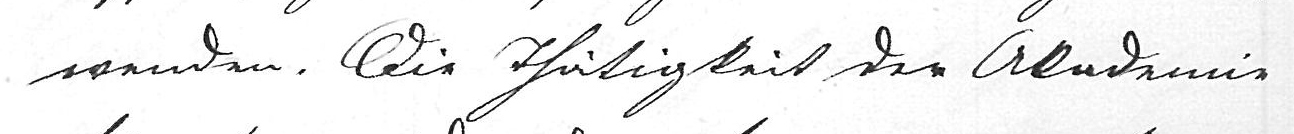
wenden. Die Thätigkeit der Akademie
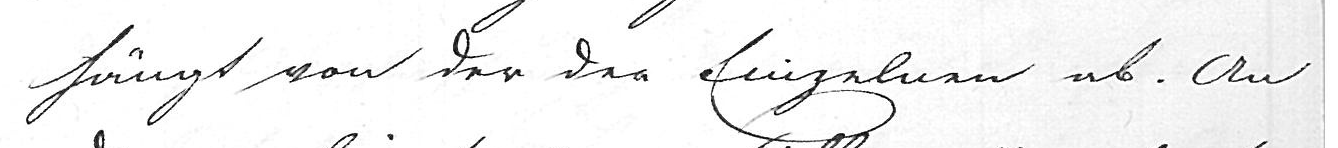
hängt von der der Einzelnen ab. An
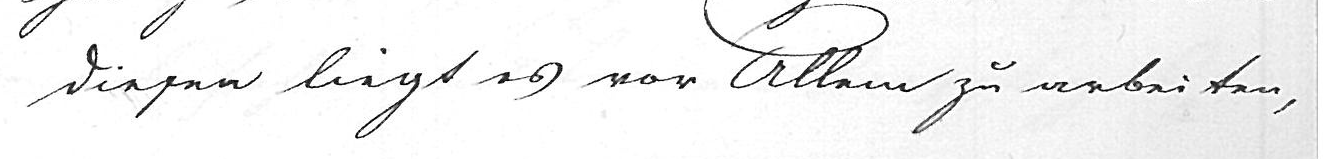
diesen liegt es vor Allem zu arbeiten,
